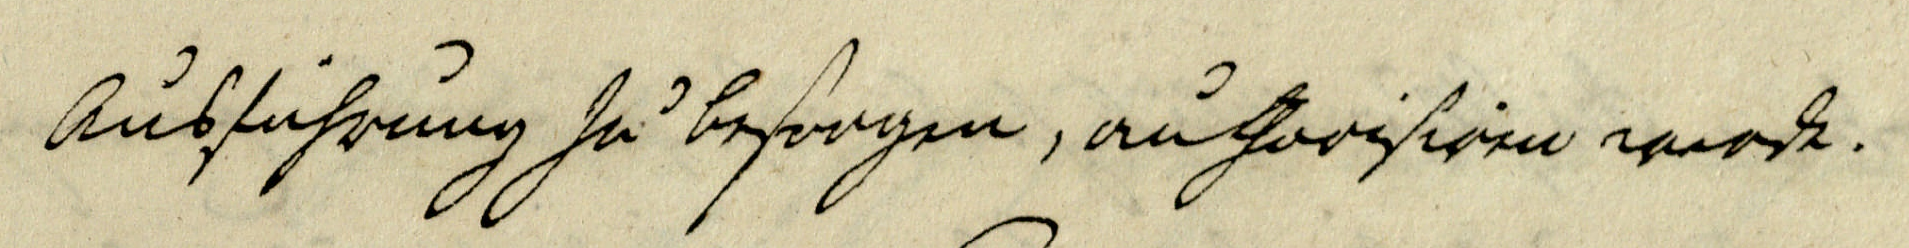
Ausführung zu besorgen, authorisiren werde.
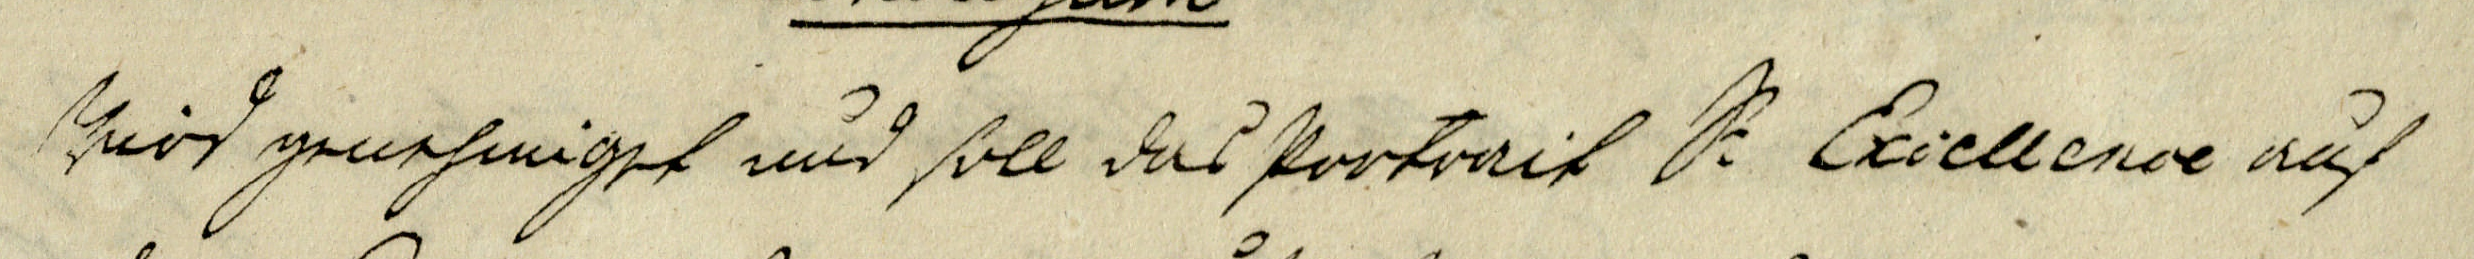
Wird genehmiget und soll das Portrait Sr. Excellence auf
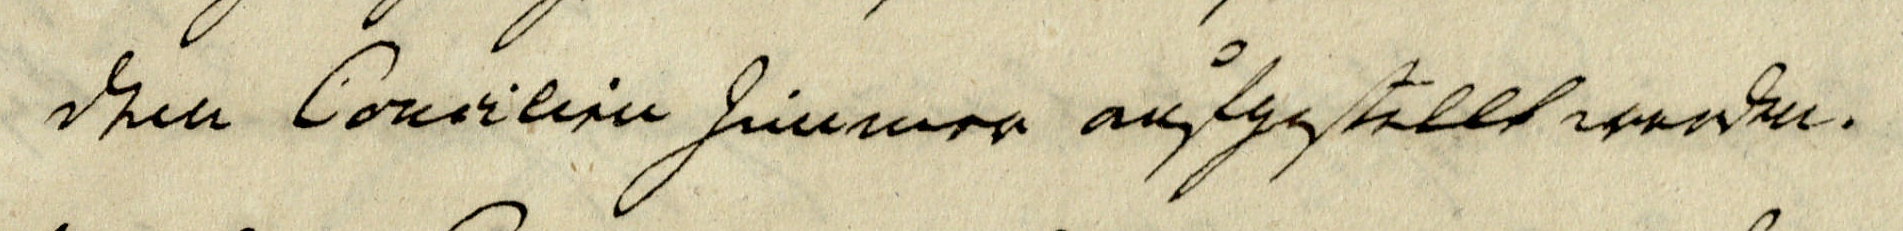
dem Concilien Zimmer aufgestellt werden.
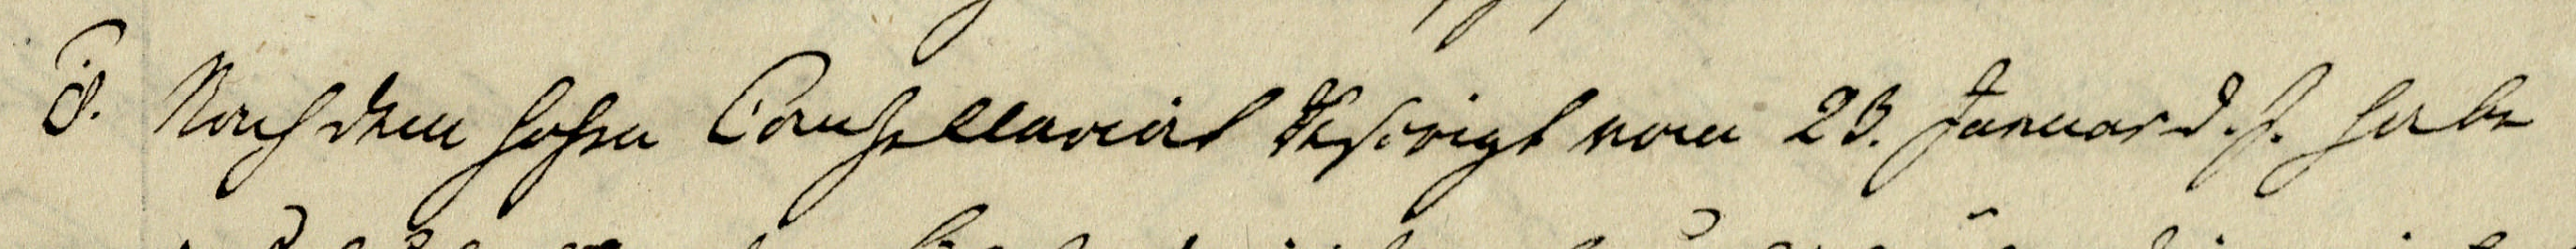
8. Nach dem hohen Canzellariat Rescript vom 23. Januar d. J. habe
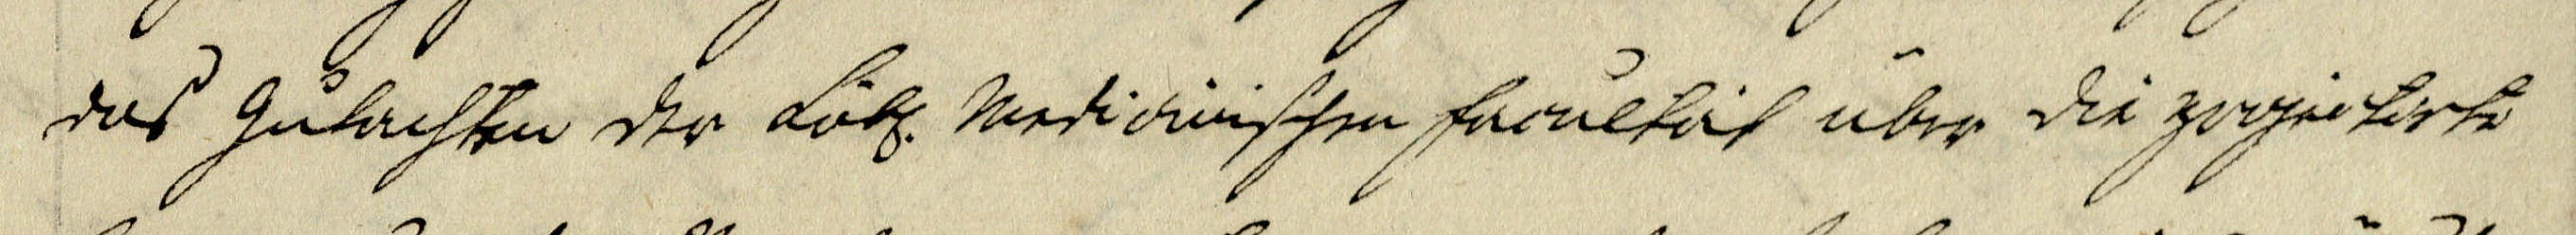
das Gutachten der Löbl. Medicinischen Facultät über die projectirte
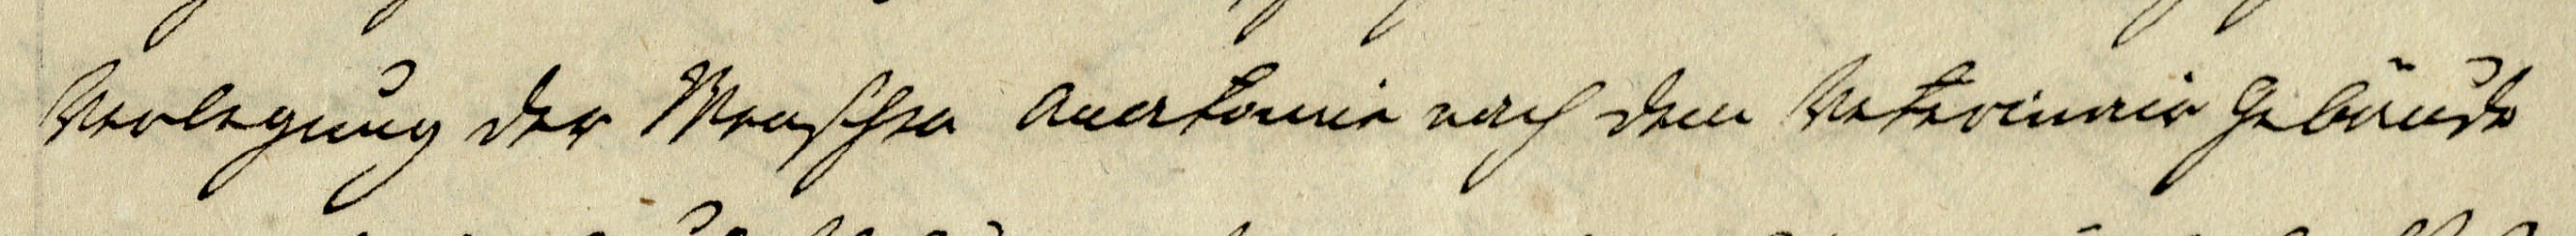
Verlegung der Menschen Anatomie nach dem Veterinair Gebäude
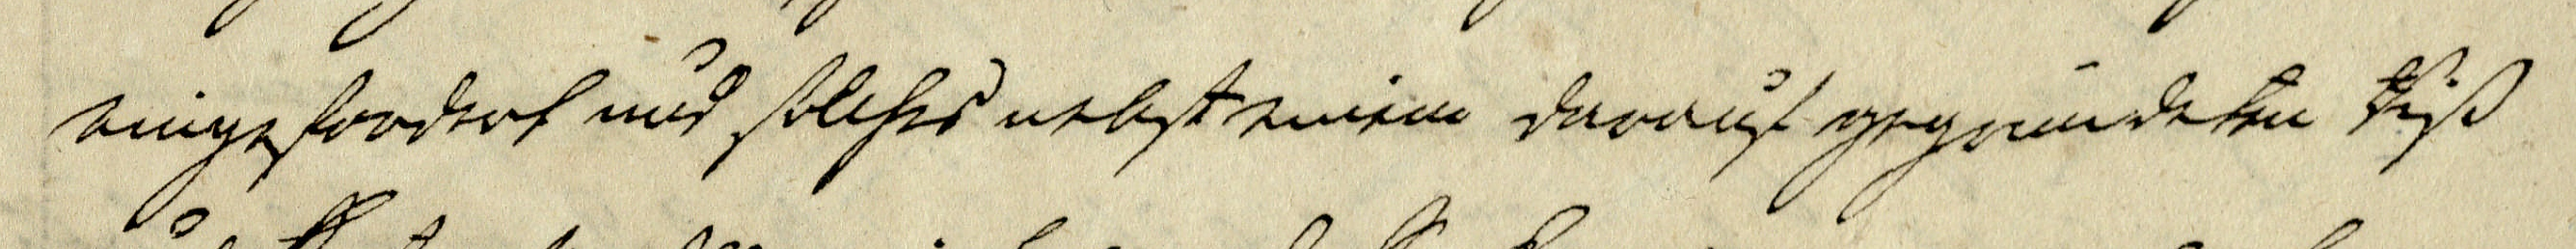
eingefordert und solches nebst einem darauf gegründeten Riß
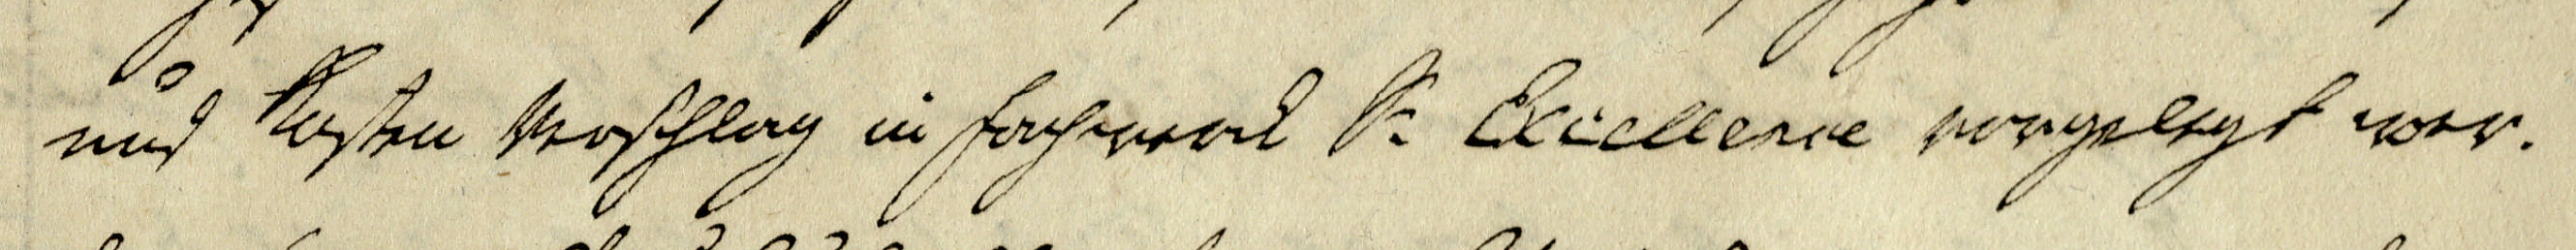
und Kosten Verschlag in Fachwerck Sr Excellence vorgelegt wer¬
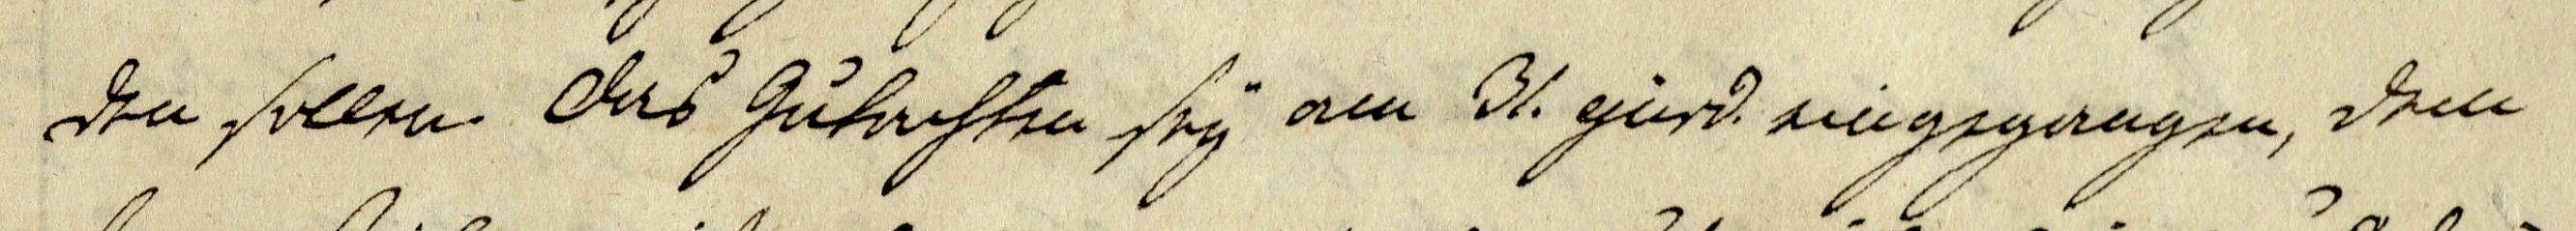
den sollen. Das Gutachten seÿ am 31. ejusd. eingegangen, dem
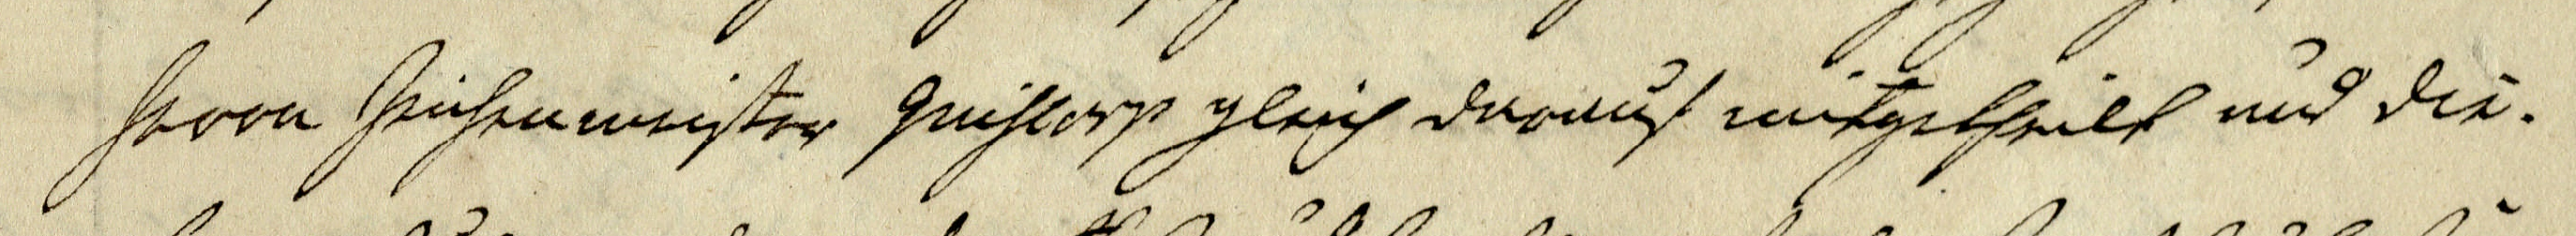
Herrn Zeichenmeister Quistorp gleich darauf mitgetheilt und die¬
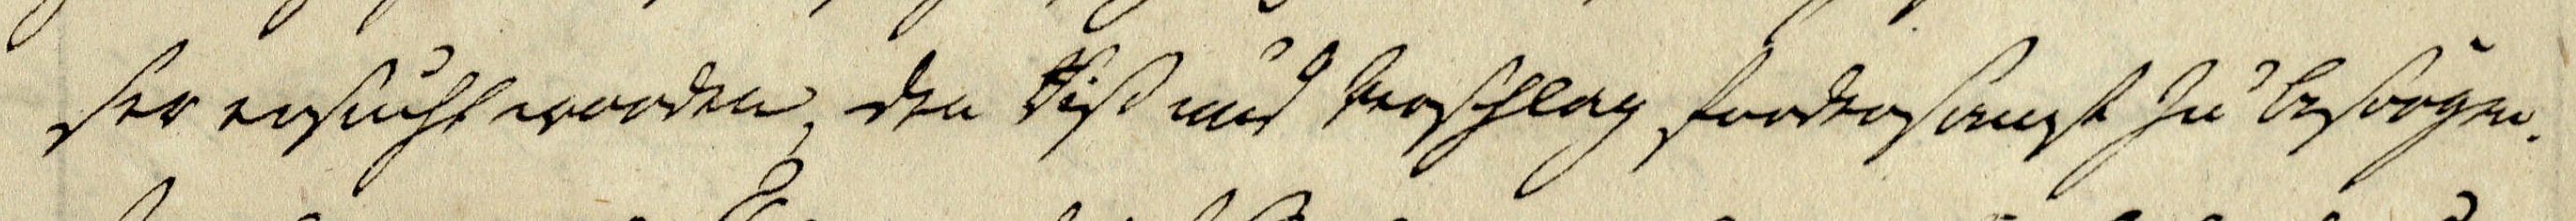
ser ersucht worden, den Riß und Verschlag fordersamst zu besorgen.
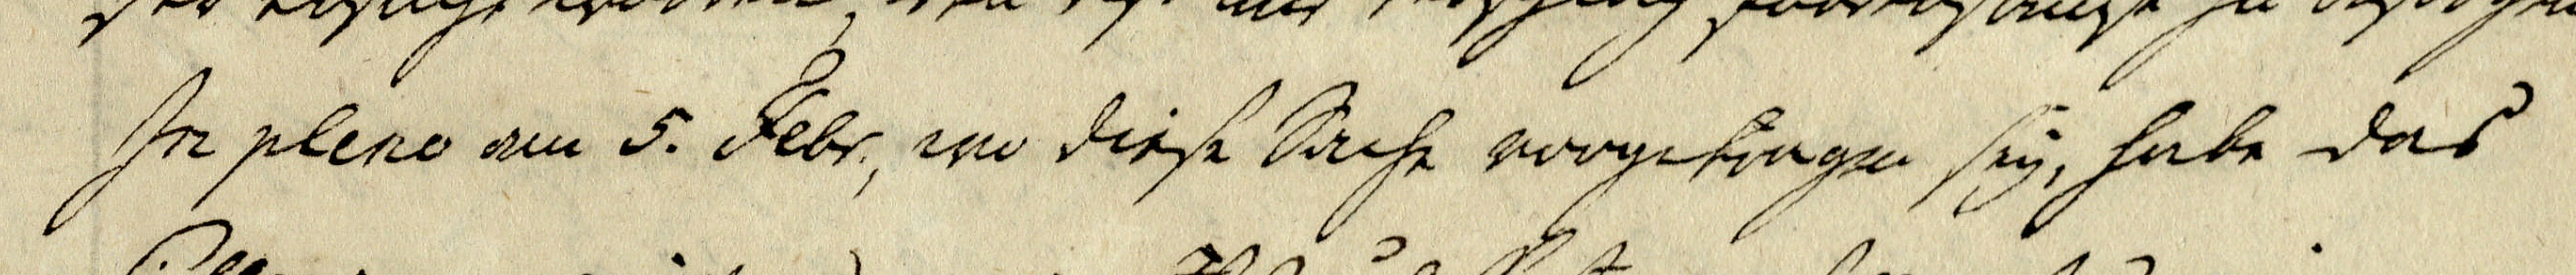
In pleno am 5. Febr., wo diese Sache vorgetragen seÿ, habe das
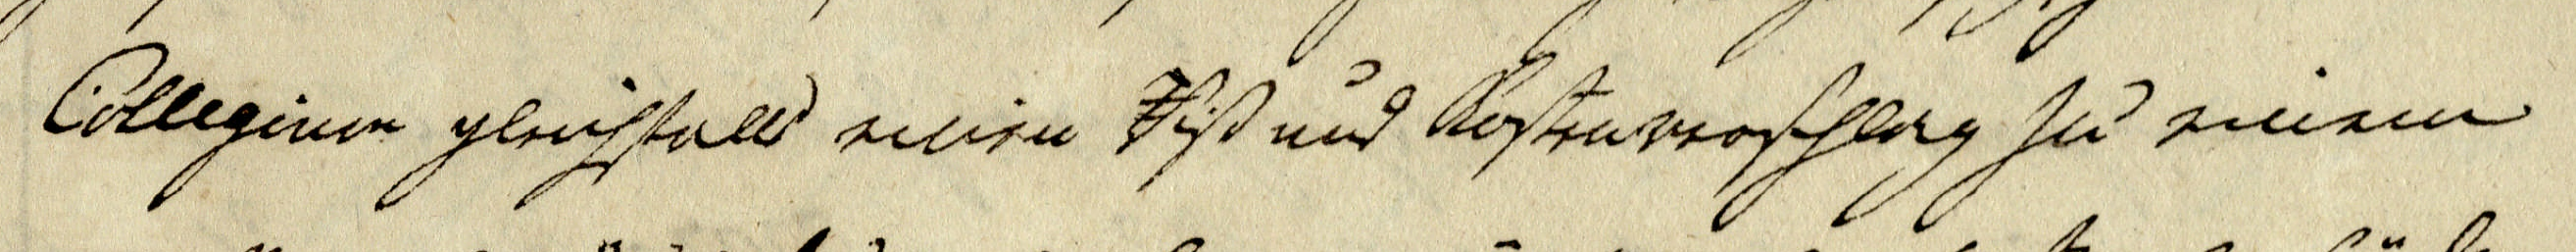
Collegium gleichfalls einen Riß und Kostenverschlag zu einem
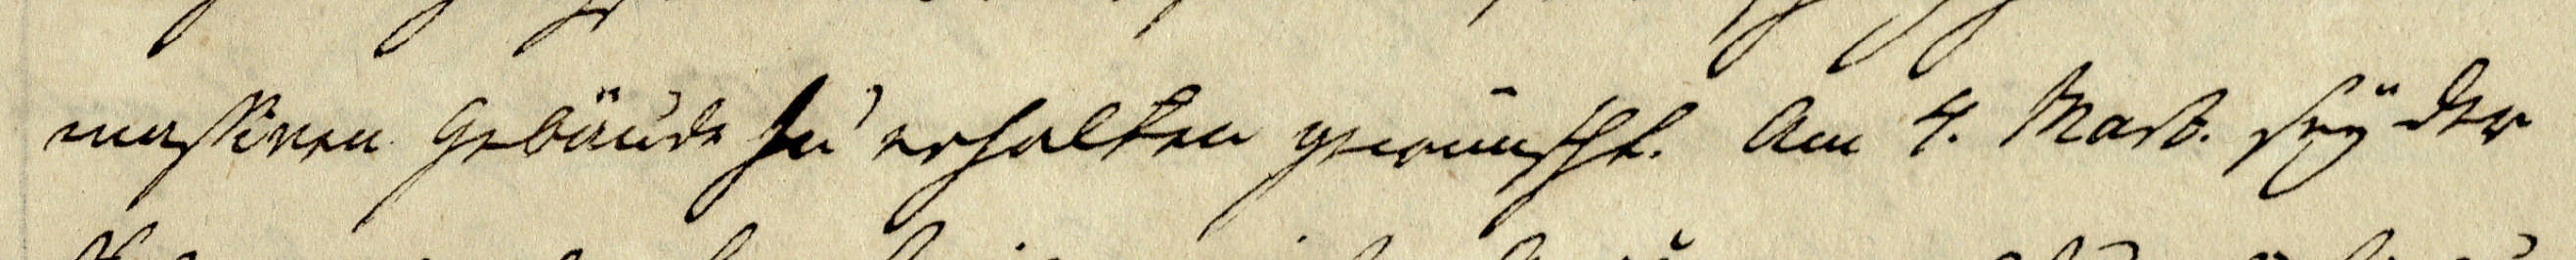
massiven Gebäude zu erhalten gewünscht. Am 4. Mart. seÿ der
